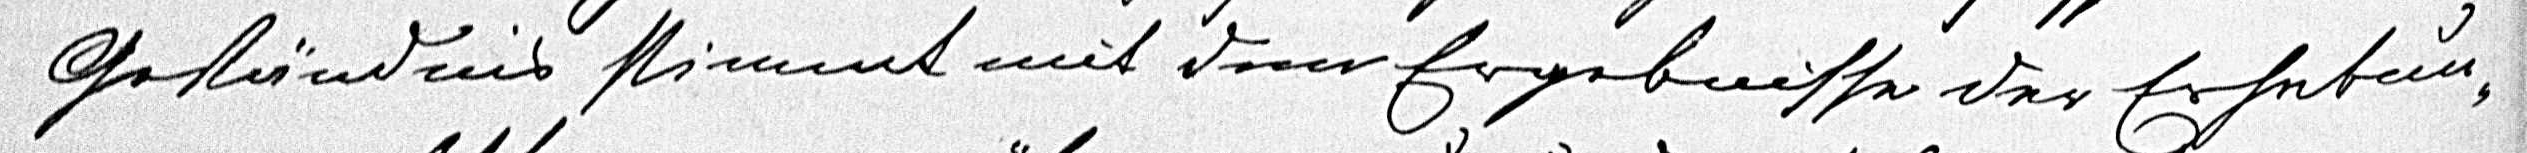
Geständnis stimmt mit dem Ergebnisse der Erhebun¬
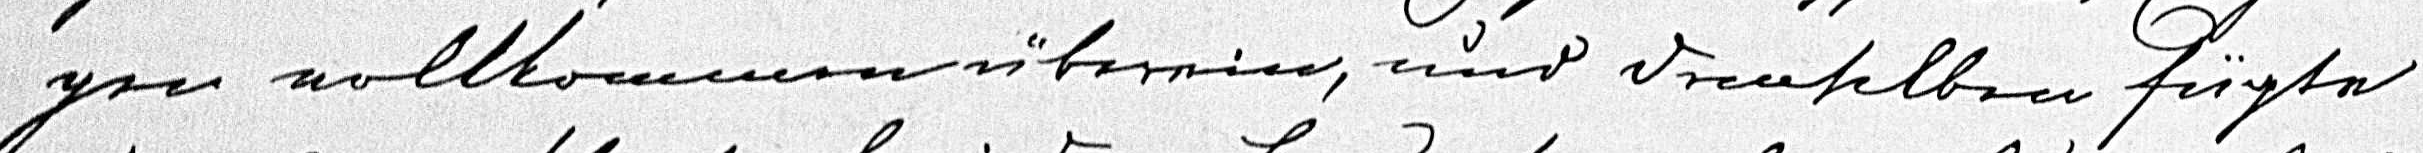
gen vollkommen überein, und demselben fügte
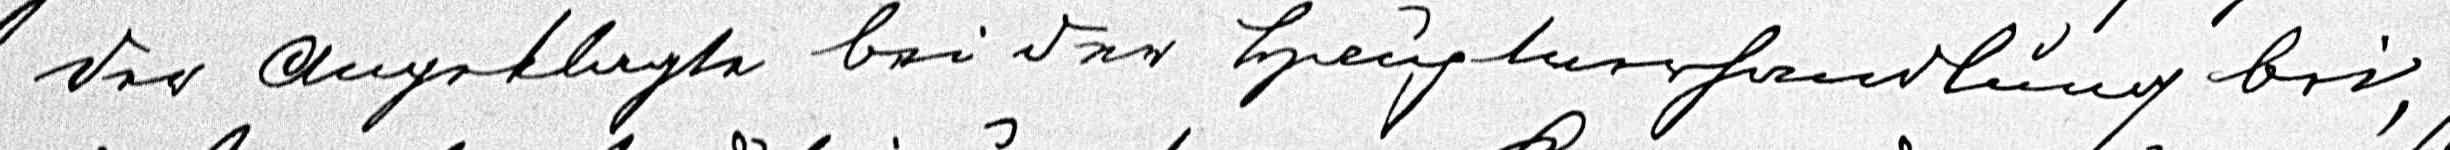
der Angeklagte bei der Hauptverhandlung bei,
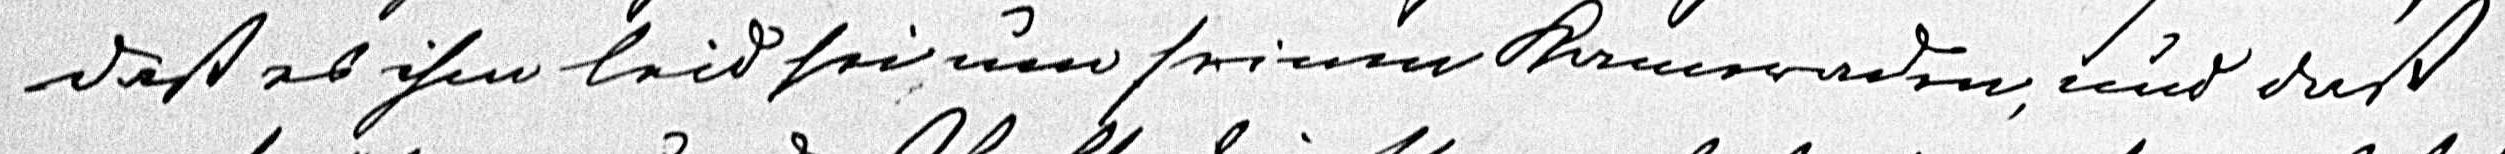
daß es ihm leid sei um seinem Kameraden, und daß
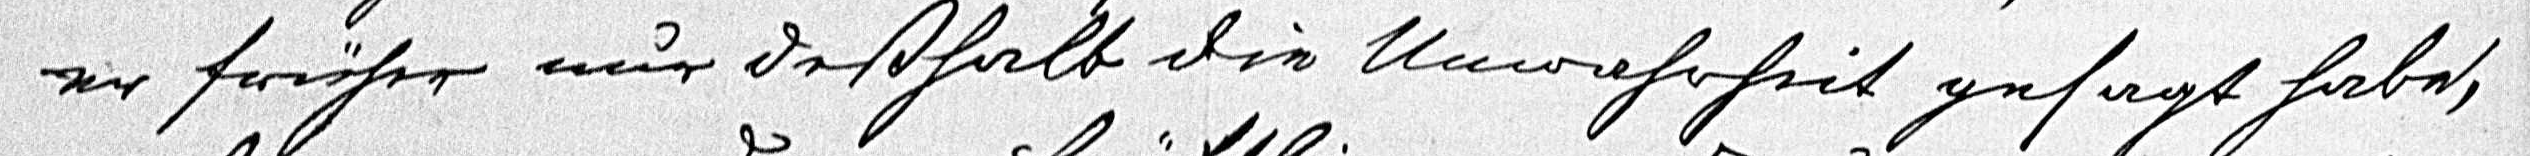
er früher nur deßhalb die Unwahrheit gesagt habe,
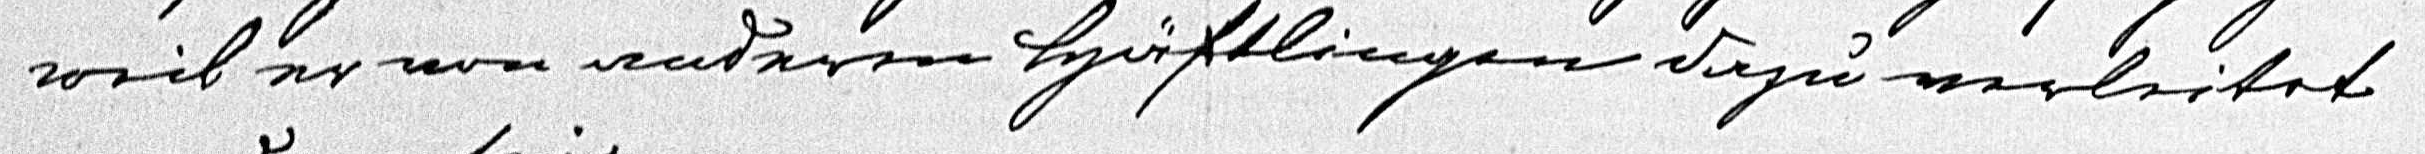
weil er von anderen Häftlingen dazu verleitet
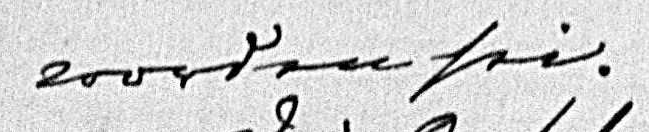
worden sei.
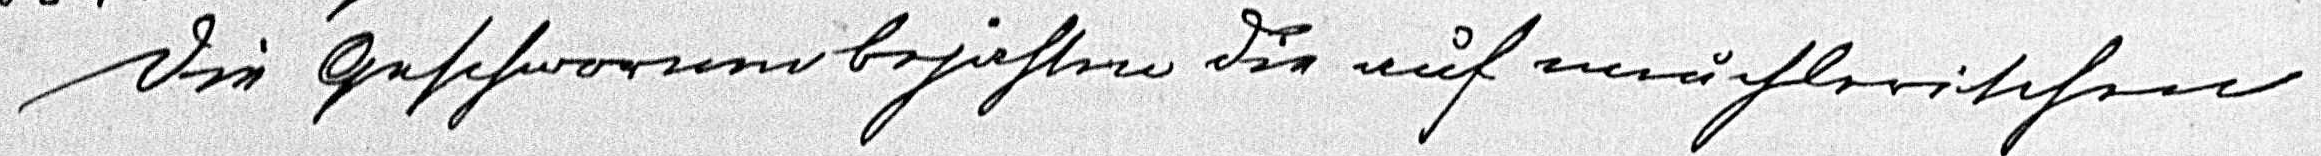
Die Geschwornen bejahten die auf meuchlerischen
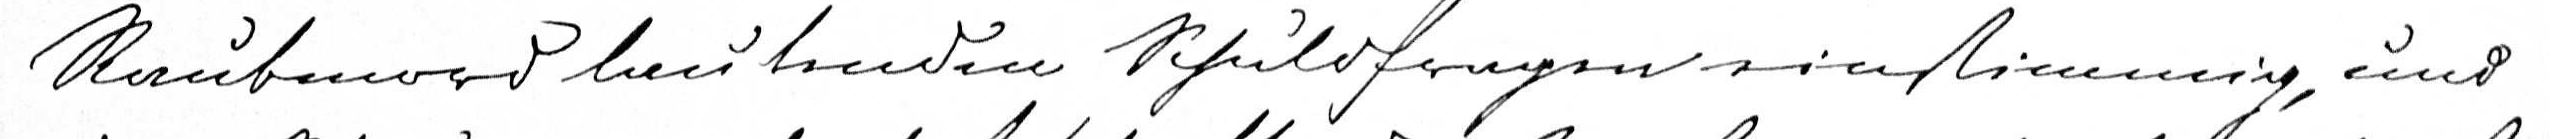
Raubmord lautenden Schuldfrage einstimmig, und
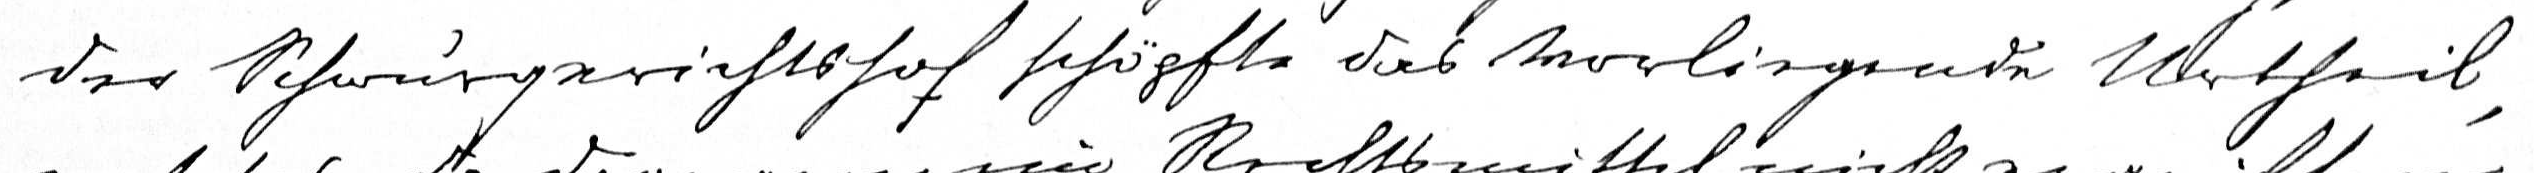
der Schwurgerichtshof schöpfte das vorliegende Urtheil,
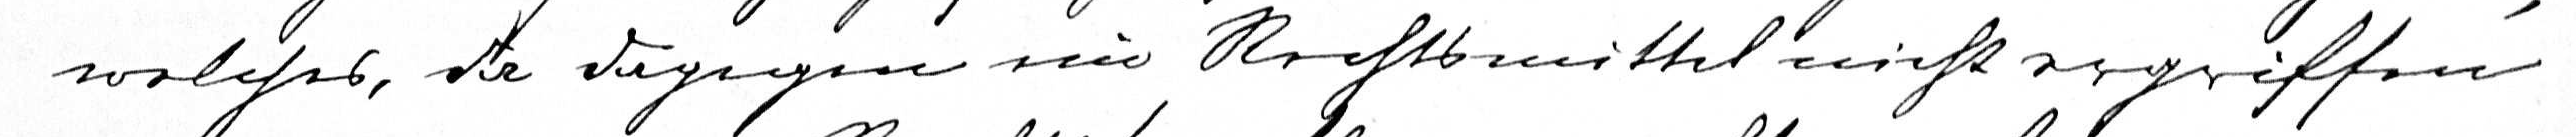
welches, da dagegen ein Rechtsmittel nicht ergriffen
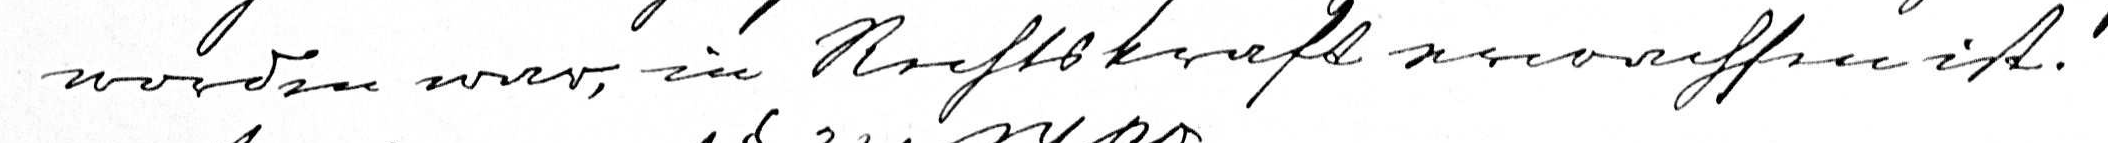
worden war, in Rechtskraft erwachsen ist.
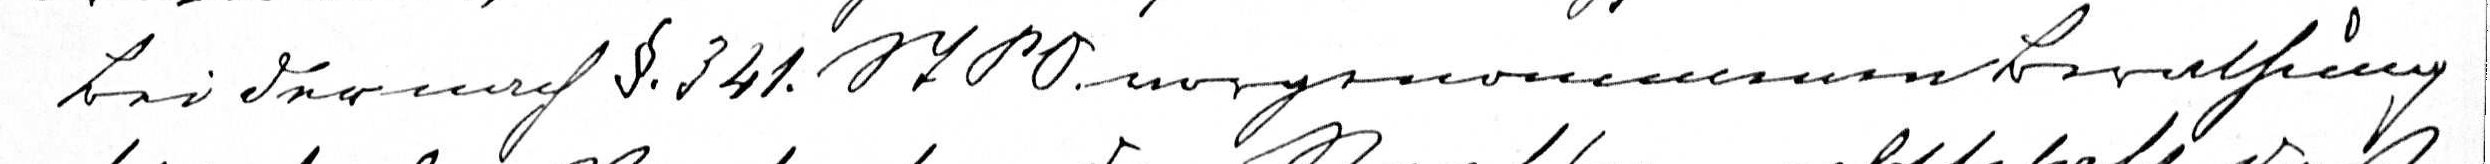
Bei der nach §341 STPO vorgenommenen Berathung
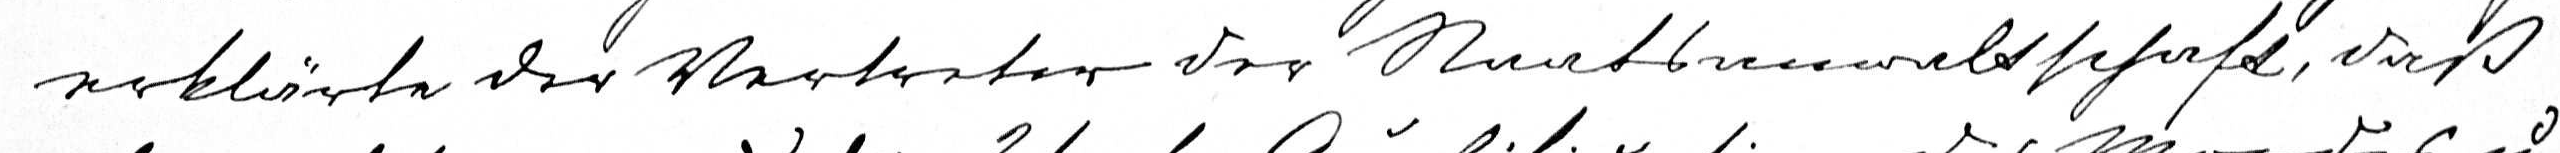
erklärte der Vertreter er Staatsanwaltschaft, daß
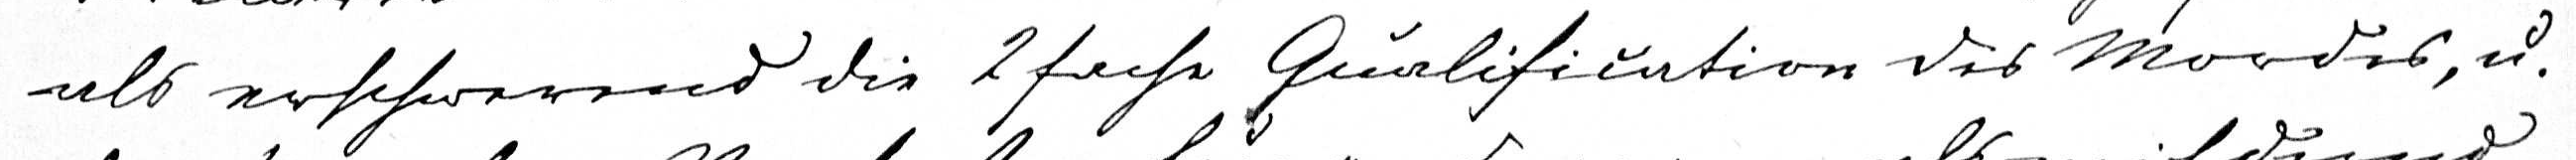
als erschwerend die 2fache Qualification des Mordes, u.
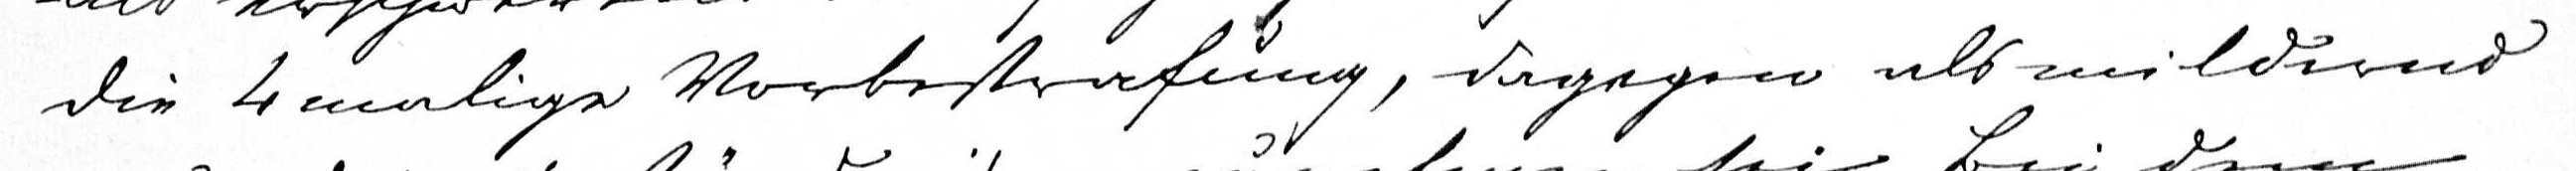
die 4 malige Vorbestrafung, dagegen als mildernd
